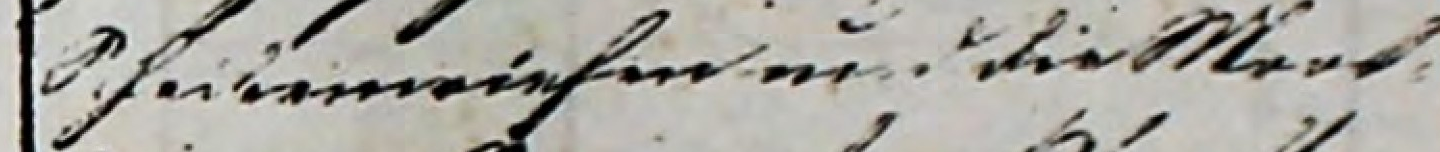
P. Federnwiesen und die Mars„
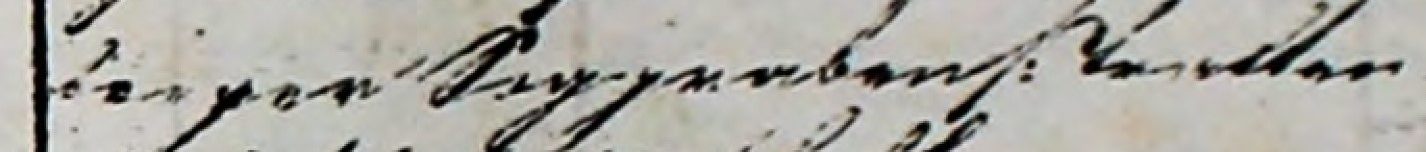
berger Sagegraben /: Tratten„
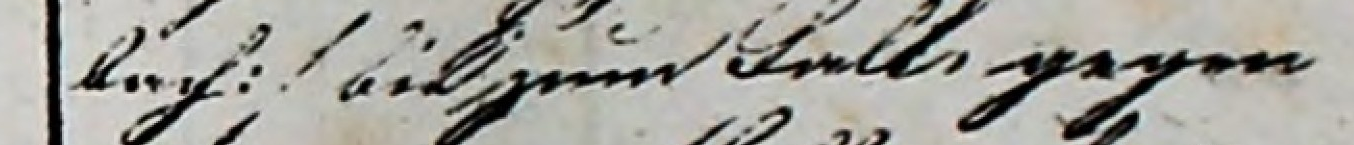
bach :/ bis zum Fall, gegen
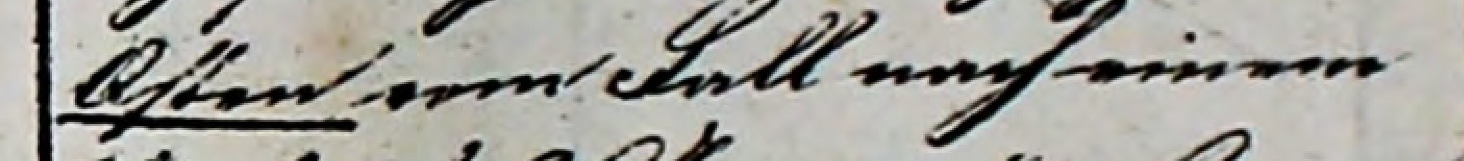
Osten vom Ffall nach ein von
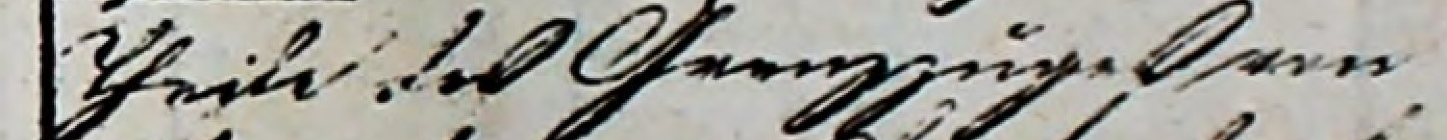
Theile des Grenzzuges von
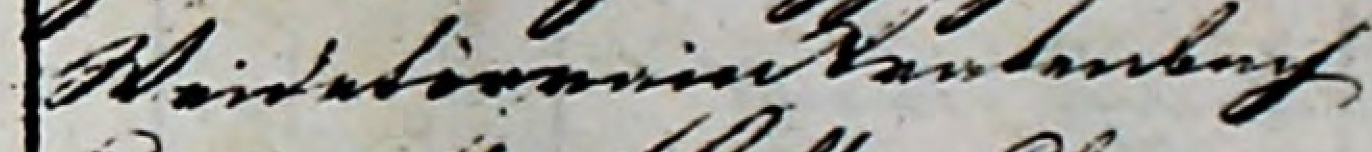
Weidetörrain Rentenbach
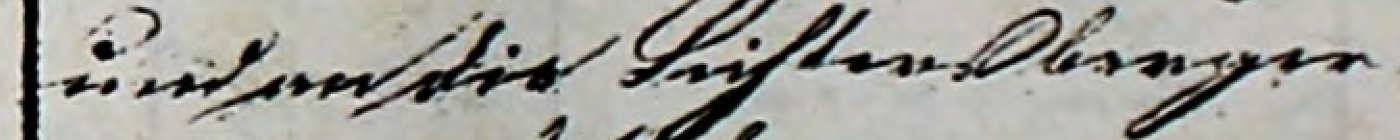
und an die Lichtersberger„
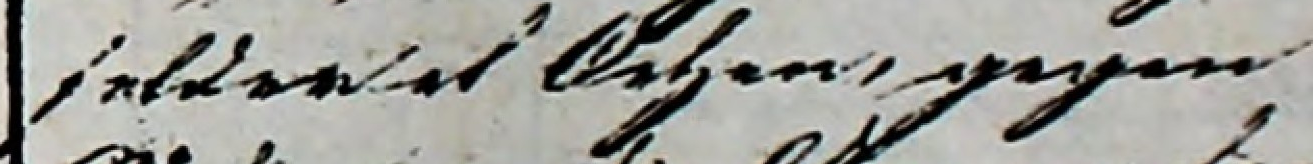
felder et Oetzen, gegen
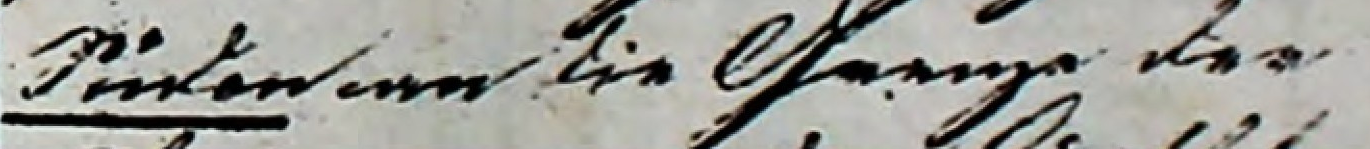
Püden an die Grenze der
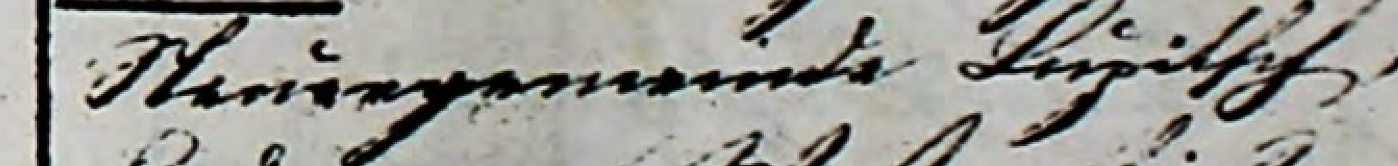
Steuergemeinde Lupitsch,
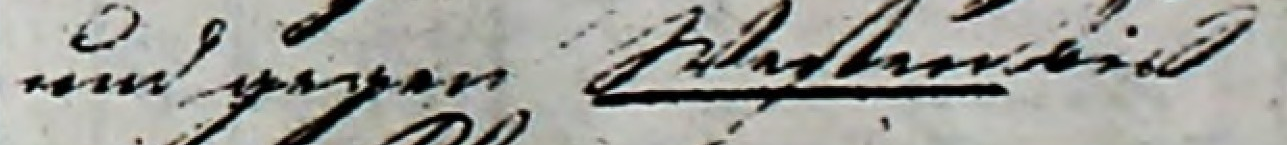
und gegen Westen bis
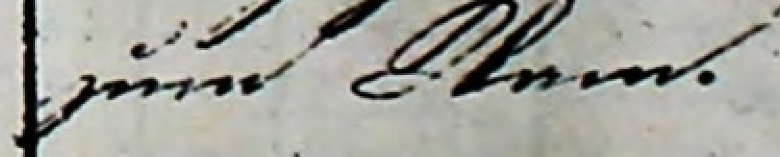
zum Klaus.
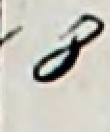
8
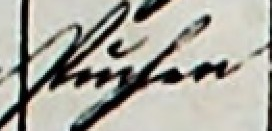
Puchen
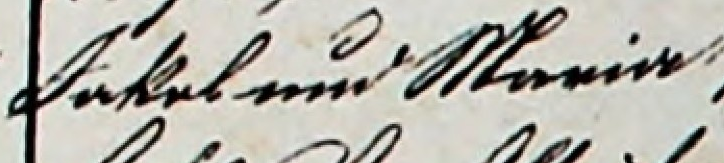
Jakob und Maria
